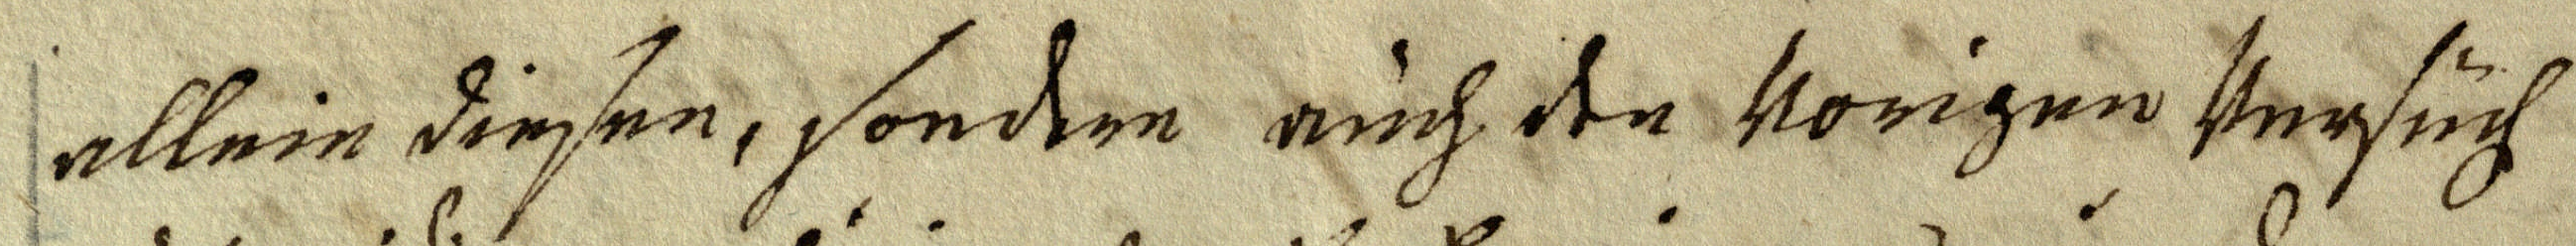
allein diesen, sondern auch den vorigen Versuch
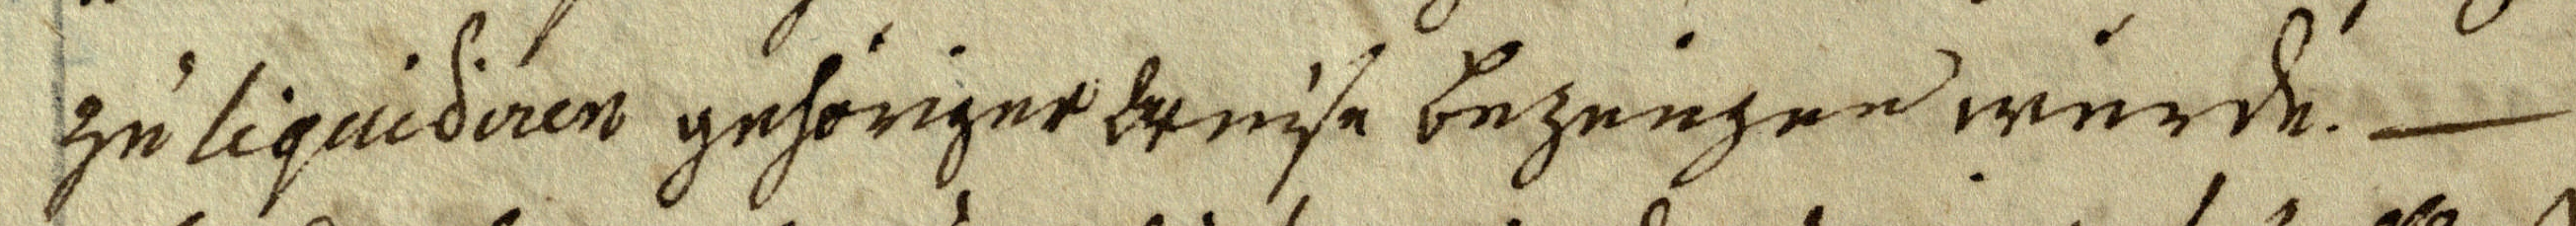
zu liquidiren gehöriger Weise bezeugen würde. -
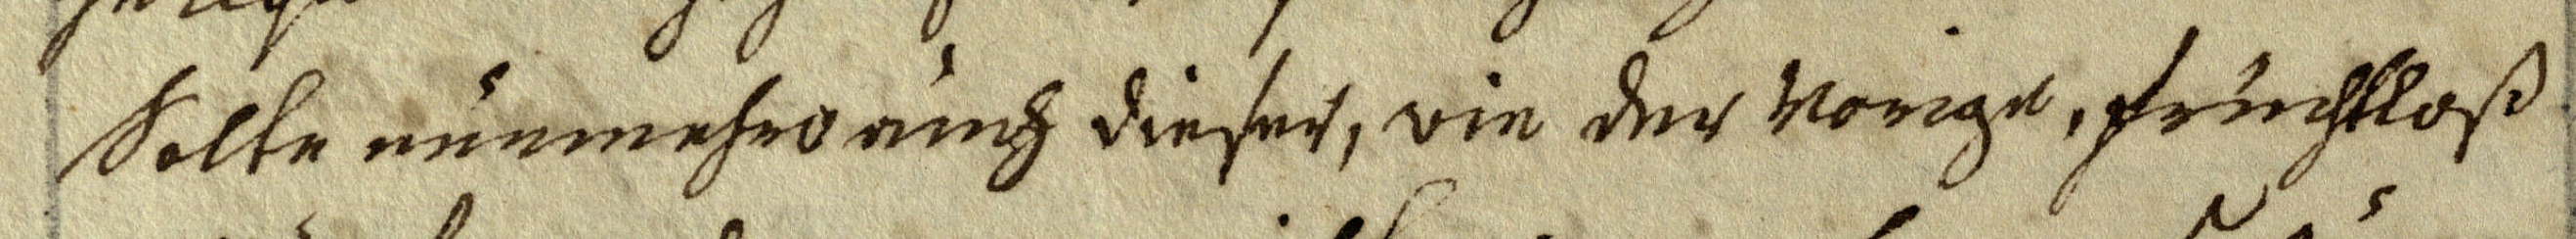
Solte nunmehro dieser, wie der vorige, fruchtloß
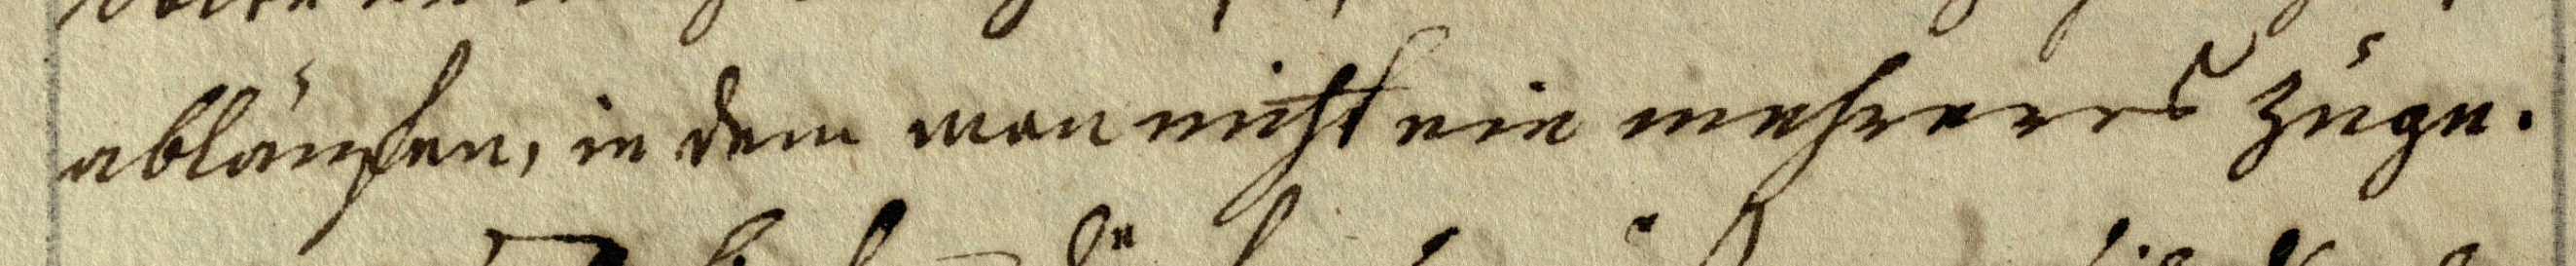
ablaufen, in dem man nicht ein mehreres zuge¬
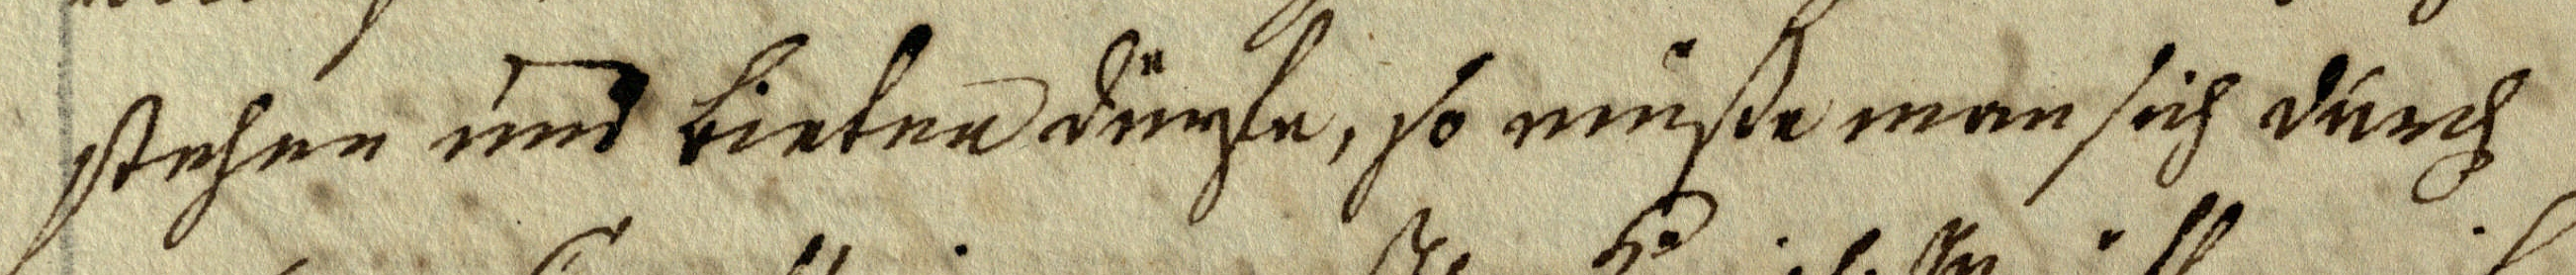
stehen und bieten dürfe, so müße man sich durch
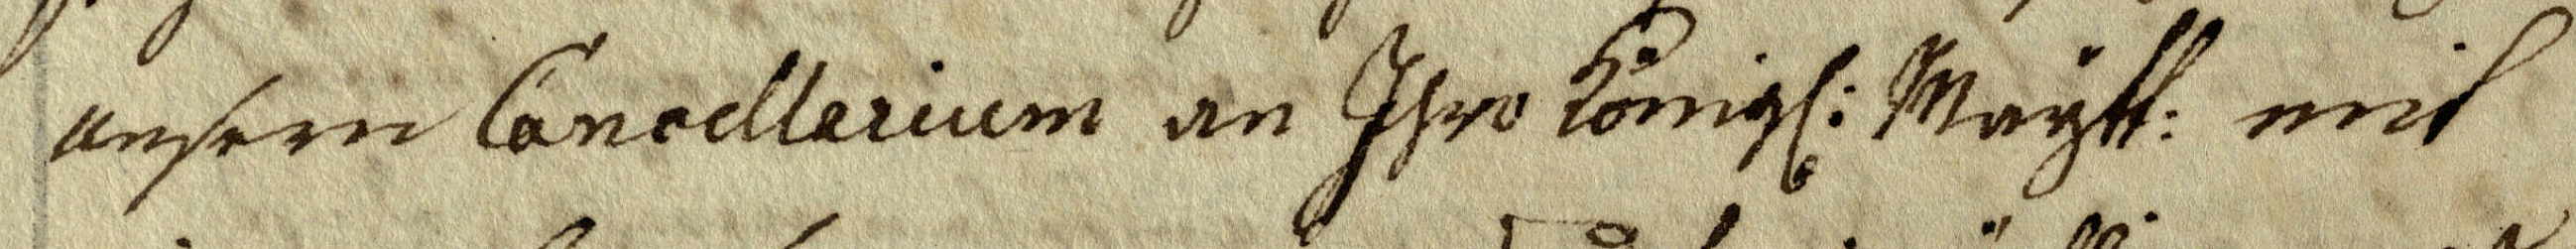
unsern Cancellarium an Ihro Königl. Maÿtt. mit
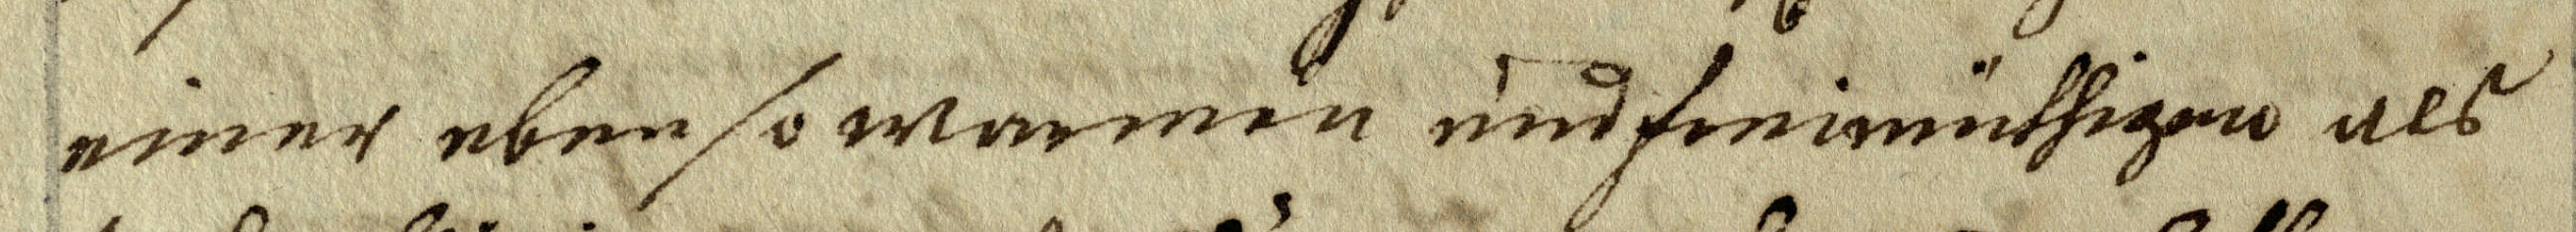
einer ebenso warmen und freimüthigen als
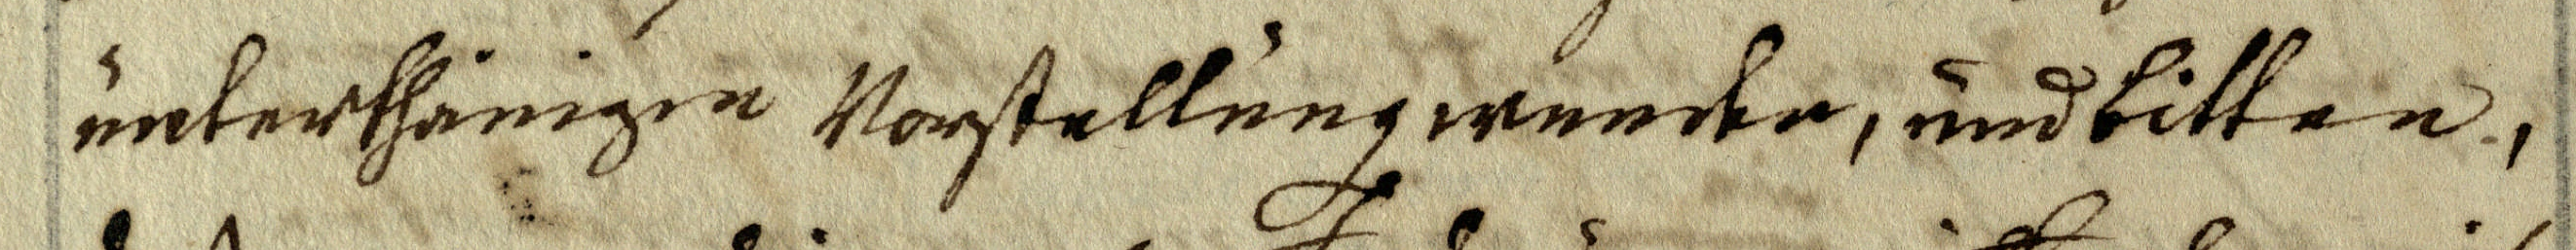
unterthänigen Vorstellung wenden, und bitten,
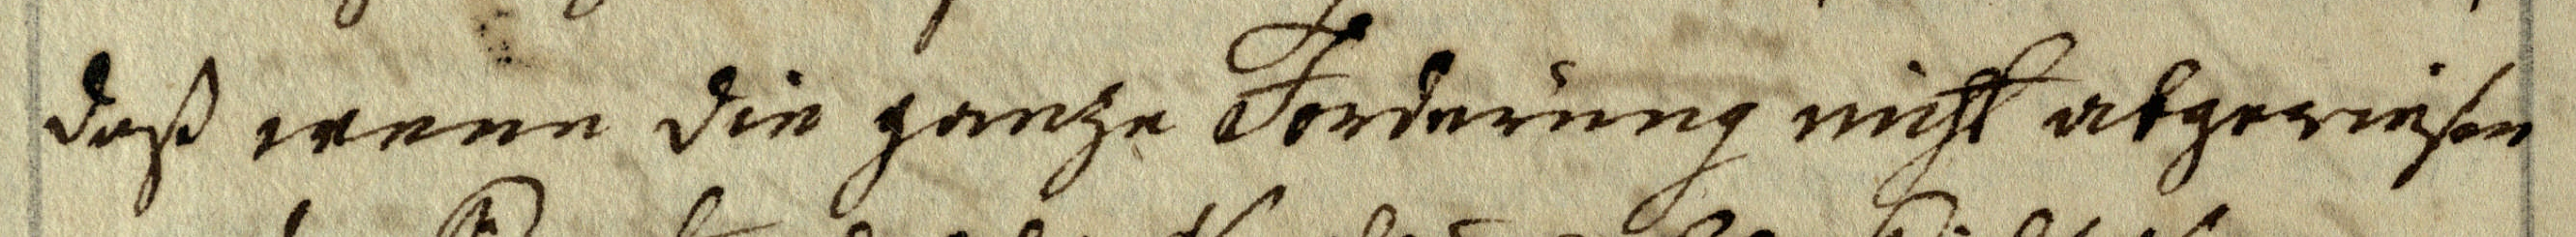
daß wenn die ganze Forderung nicht abgewiesen
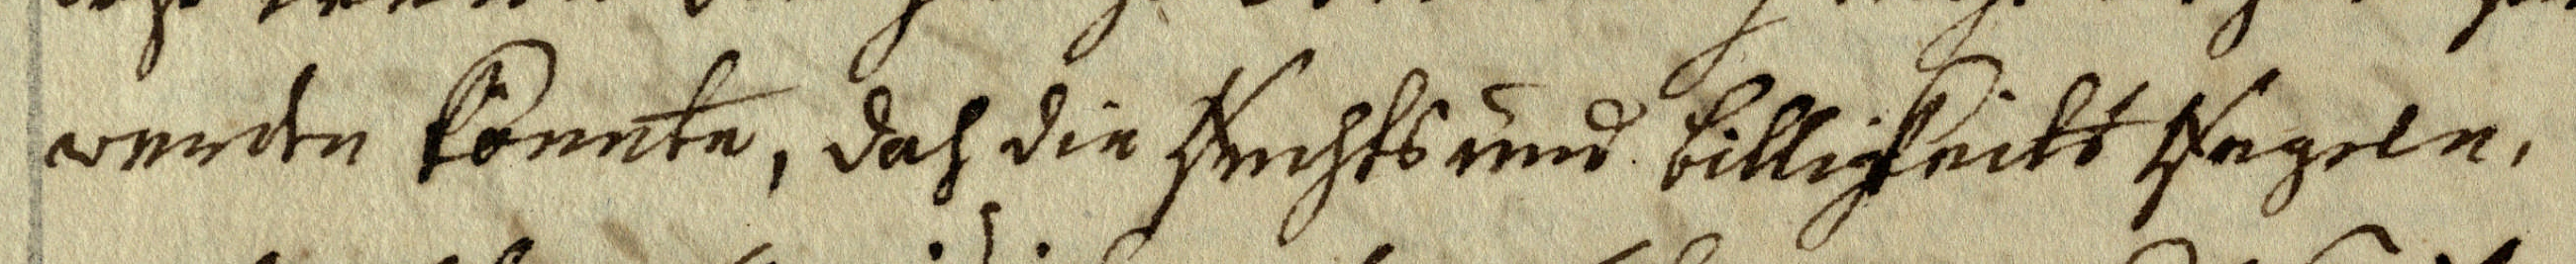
werden könnte, das die Rechts und Billigkeits Regeln,
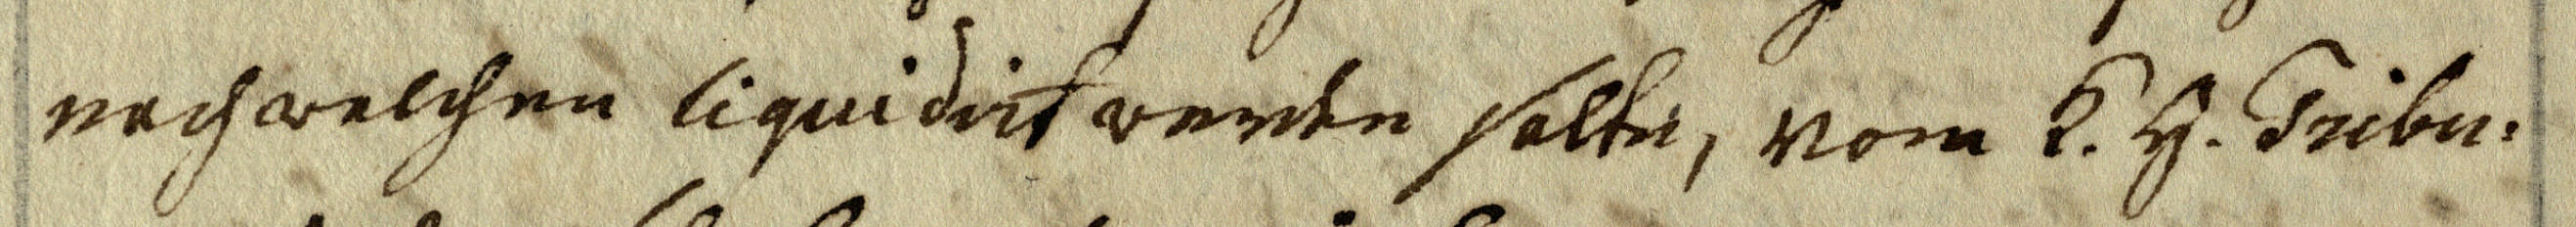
nach welchen liquidirt werden solte, vom K. H. Tribu¬
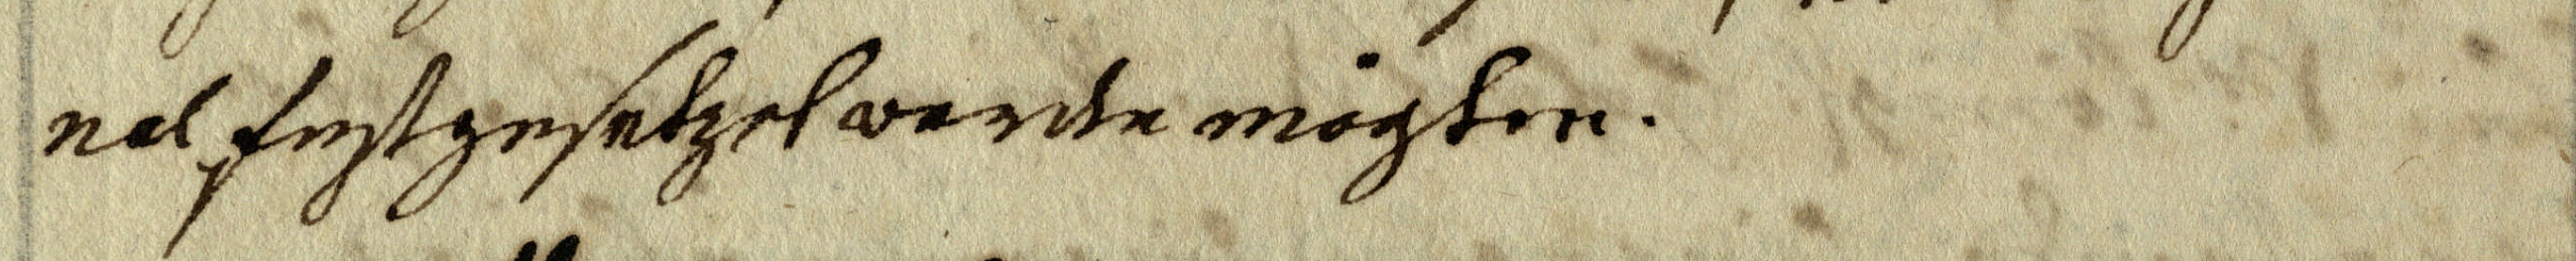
nal festgesetzet werden mögten.
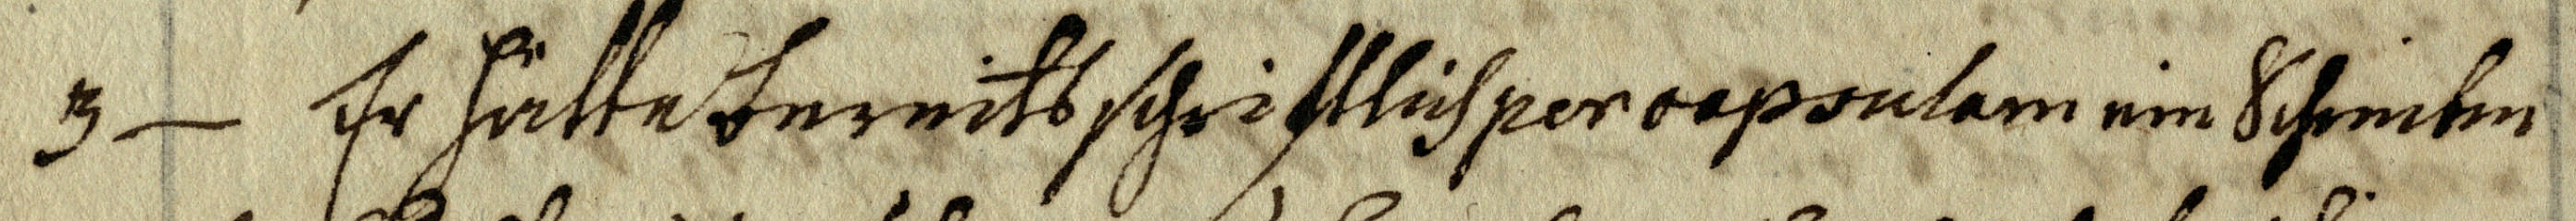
3. Er hätte bereits schriftlich per capsulam ein Schreiben
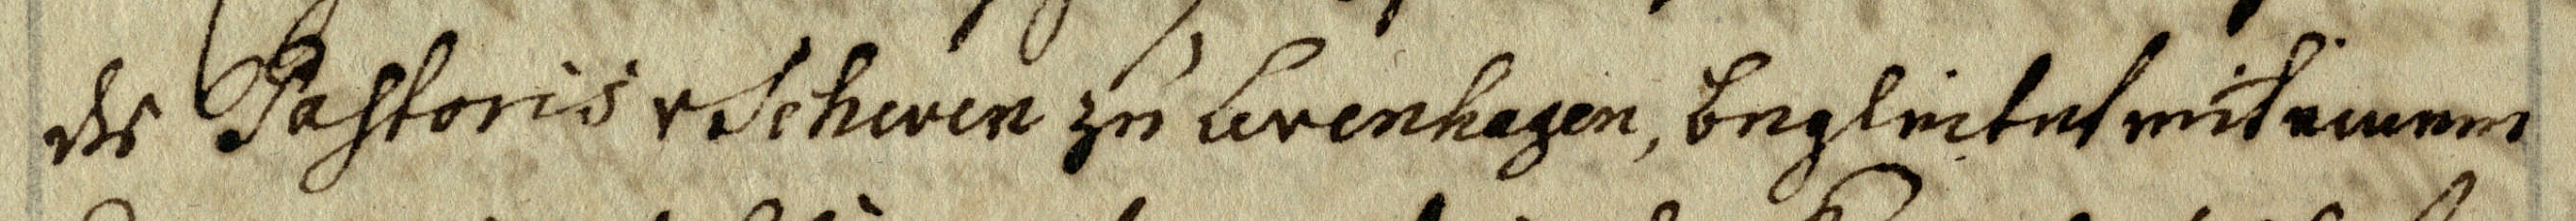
des Pastoris v Scheven zu Levenhagen, begleitet mit einem
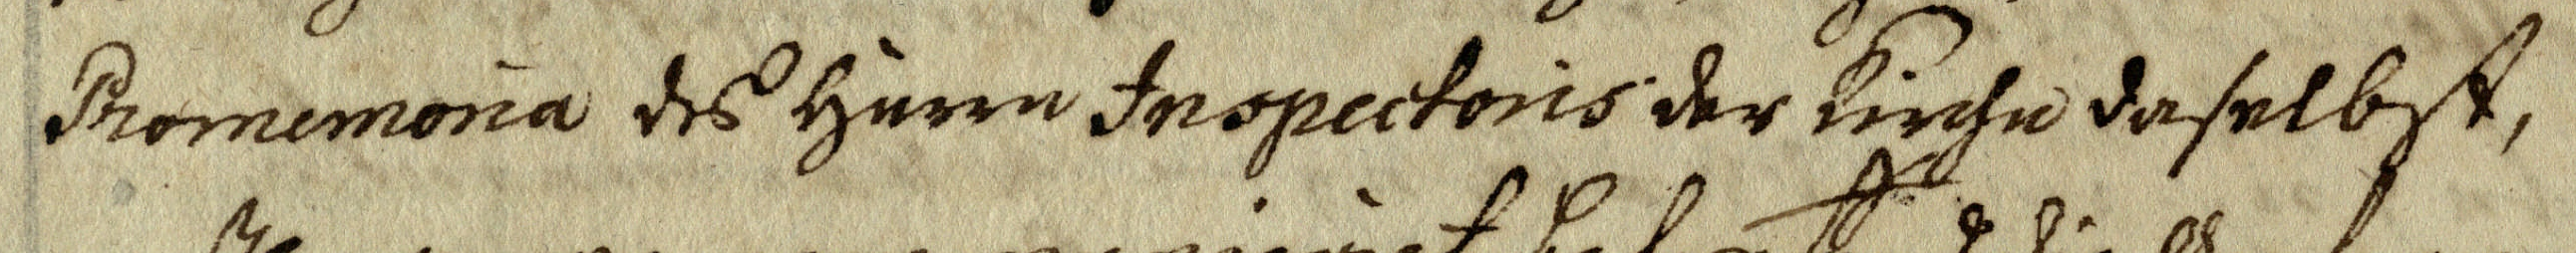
Promemoria des Herrn Inspectoris der Kirche daselbst,
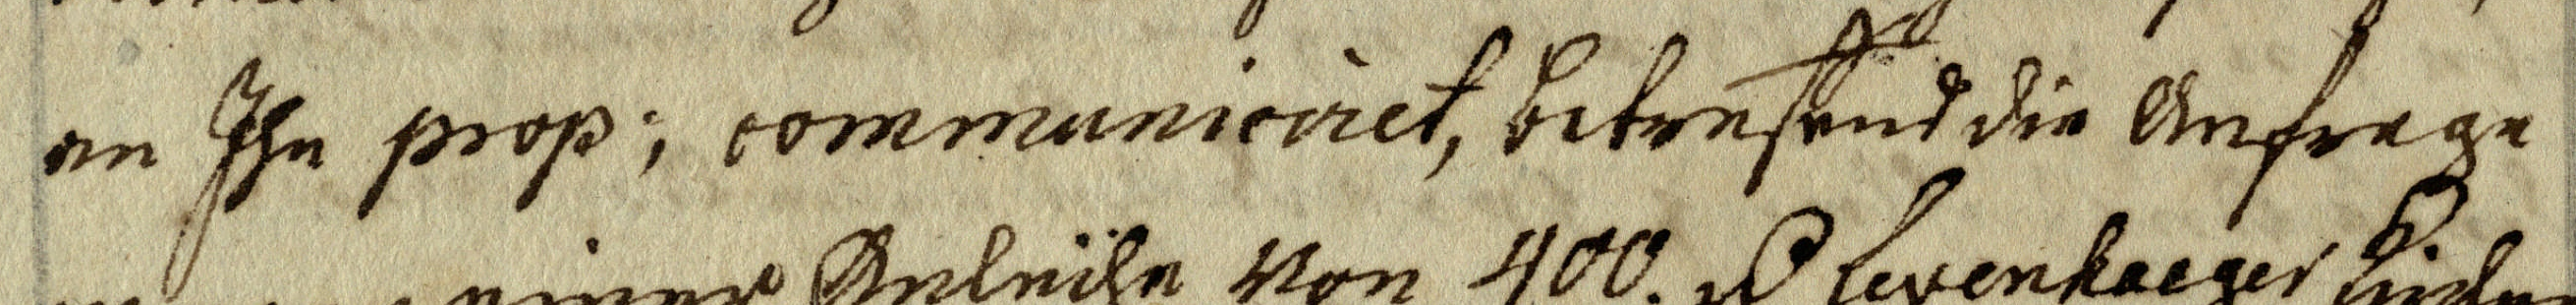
an Ihn prop. communiciret, betreffend die Anfrage
